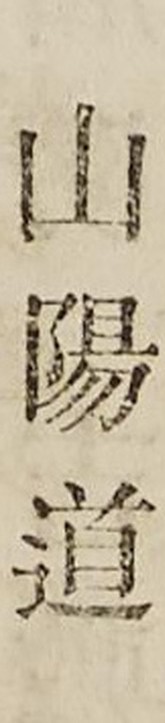山陽道

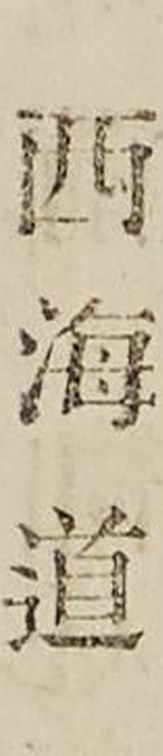西海道

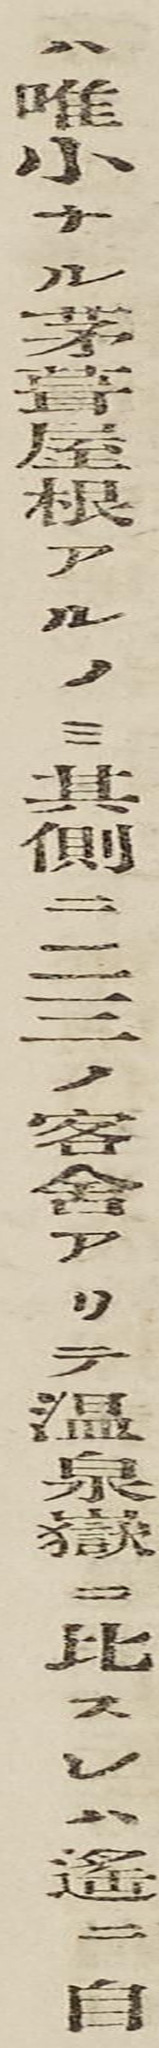ハ唯小ナル茅葺屋根アルノミ其側ニ二三ノ客舎アリテ温泉嶽ニ比スレハ遥ニ自
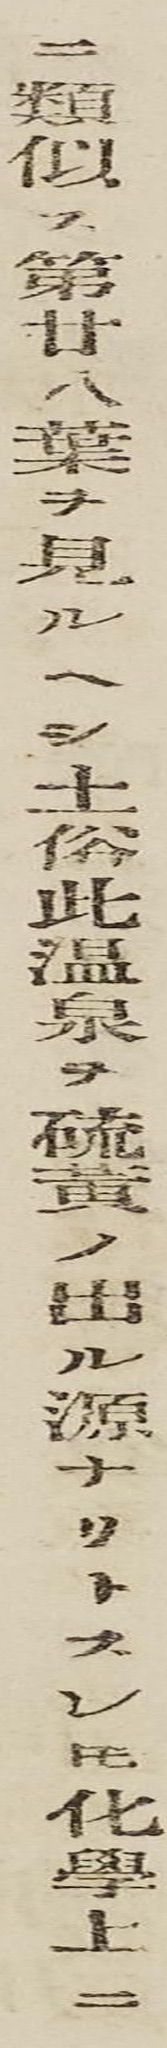ニ類似ス第廿八葉ヲ見ルヘシ土俗此温泉ヲ硫黄ノ出ル源ナリトスレトモ化学上ニ

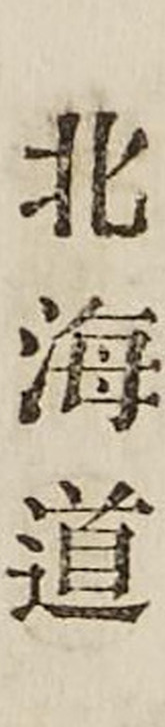北海道

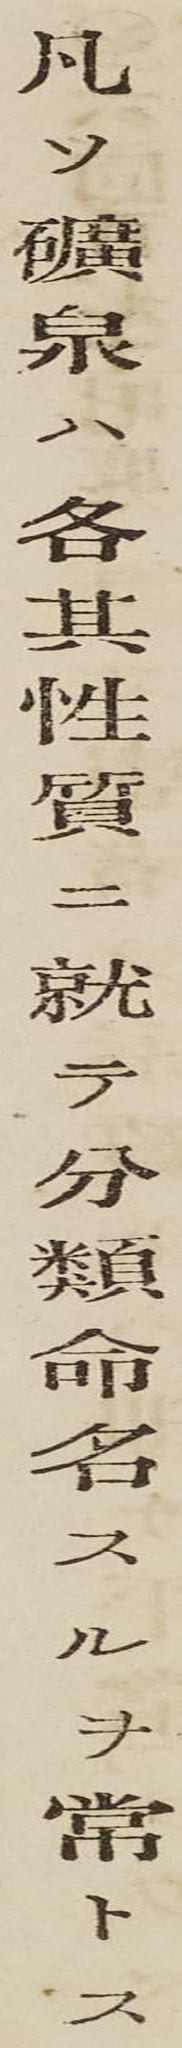凡ソ礦泉ハ各其性質ニ就テ分類命名スルヲ常トス
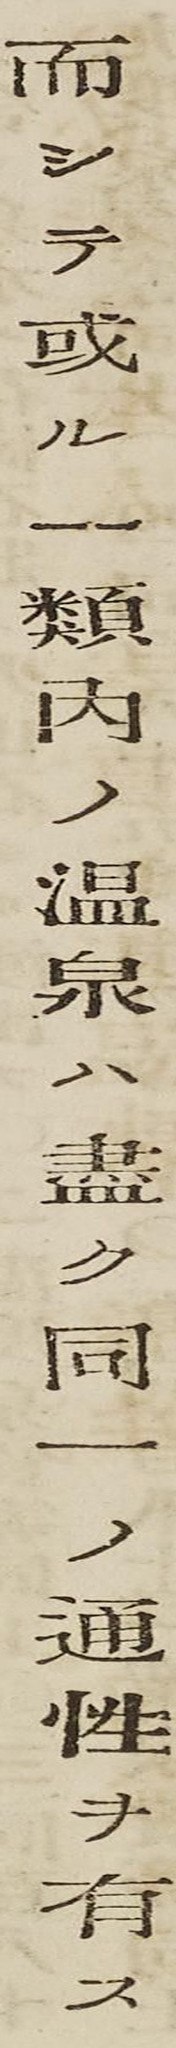而シテ或ル一類内ノ温泉ハ尽ク同一ノ通性ヲ有ス
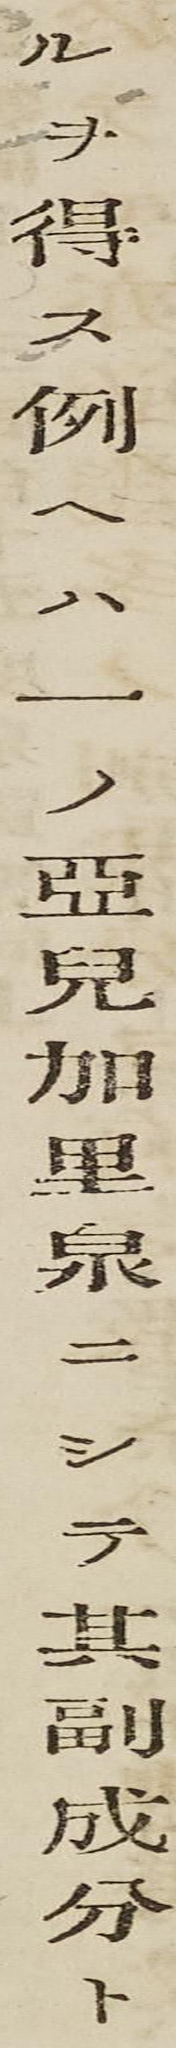ルヲ得ス例ヘハ一ノ亜児加里泉ニシテ其副成分ト
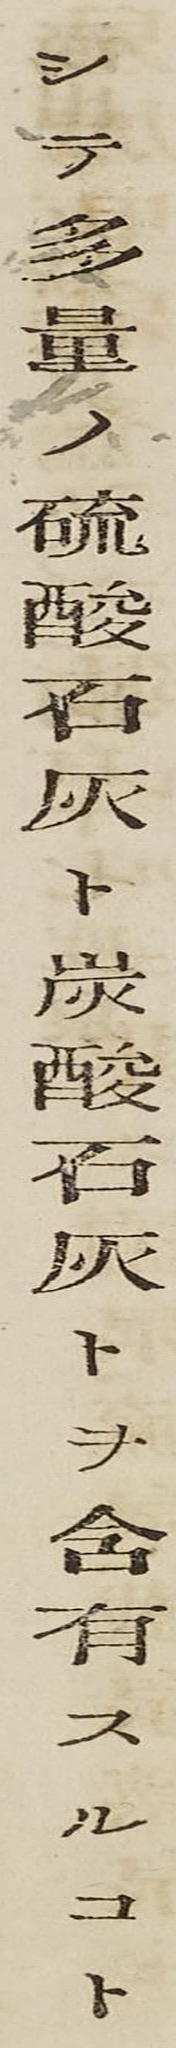シテ多量ノ硫酸石灰ト炭酸石灰トヲ含有スルコト
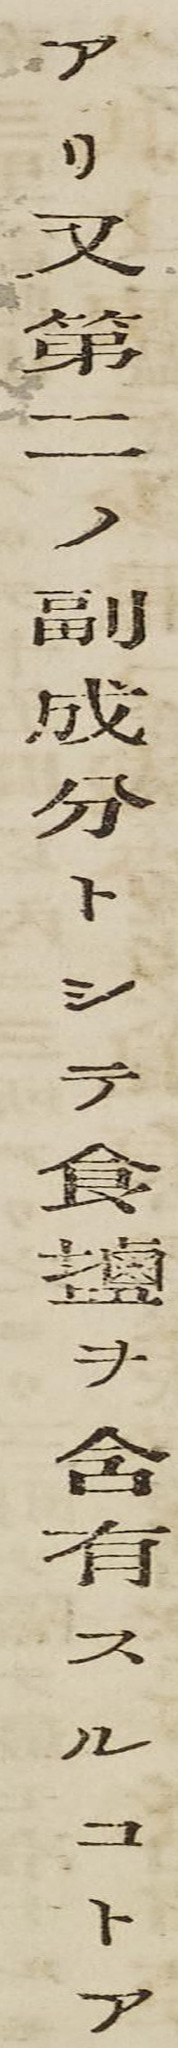アリ又第二ノ副成分トシテ食塩ヲ含有スルコトア
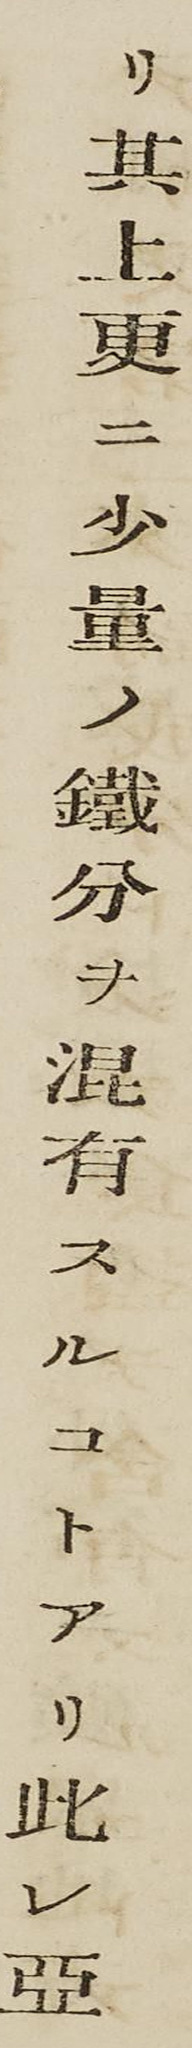リ其上更ニ少量ノ鉄分ヲ混有スルコトアリ此レ亜
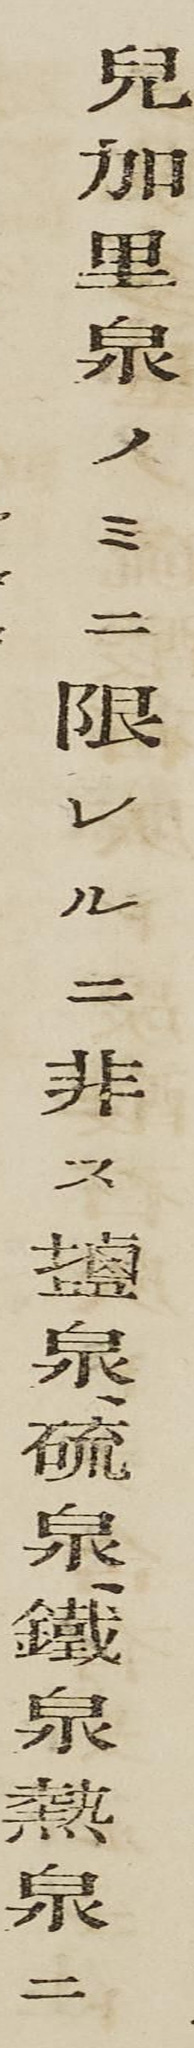児加里泉ノミニ限レルニ非ス塩泉、硫泉、鉄泉熱泉ニ
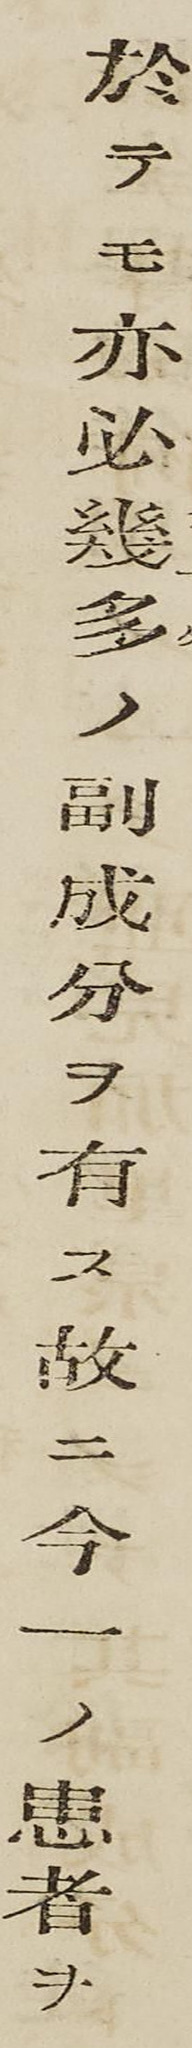於テモ亦必幾多ノ副成分ヲ有ス故ニ今一ノ患者ヲ
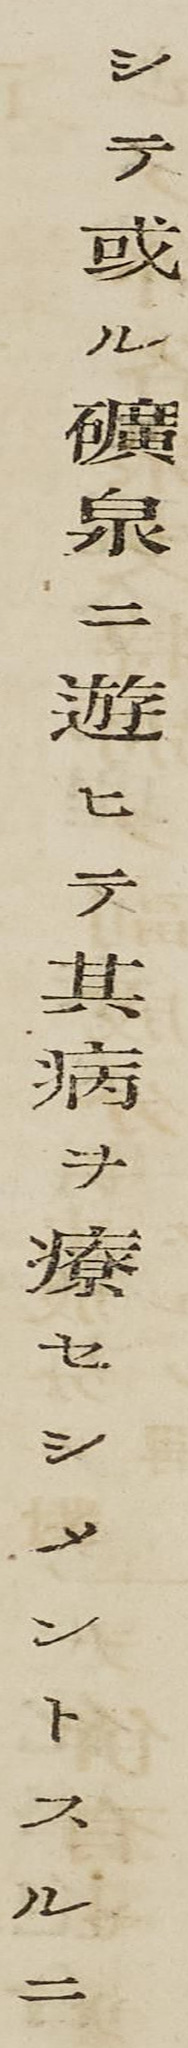シテ或ル礦泉ニ遊ヒテ其病ヲ療セシメントスルニ
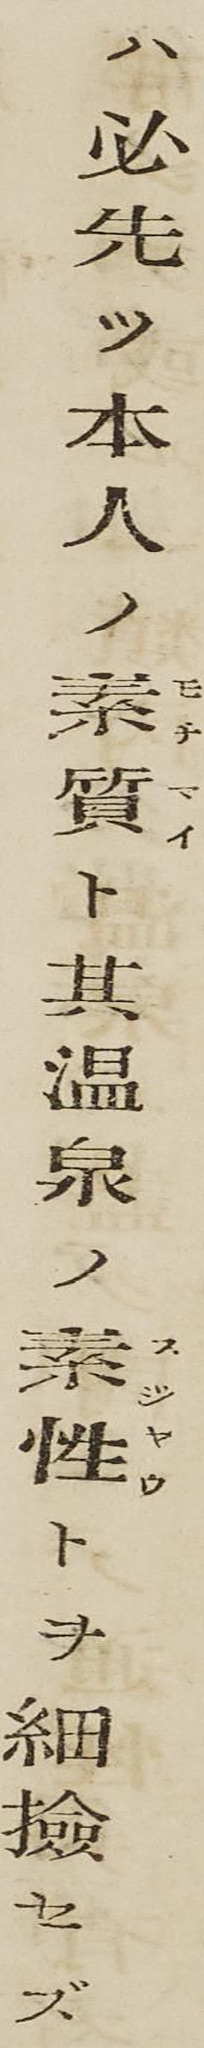ハ必先ツ本人ノ素質ト其温泉ノ素性トヲ細斂セズ
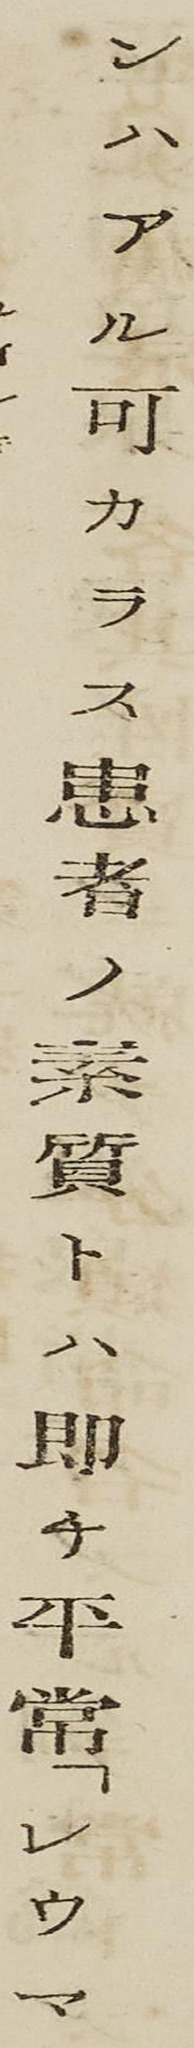ンハアル可カラス患者ノ素質トハ即チ平常「レウマ
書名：日本温泉考
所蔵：東京大学地震研究所図書室 Earthquake Research Institute Library, The University of Tokyo, JAPAN
